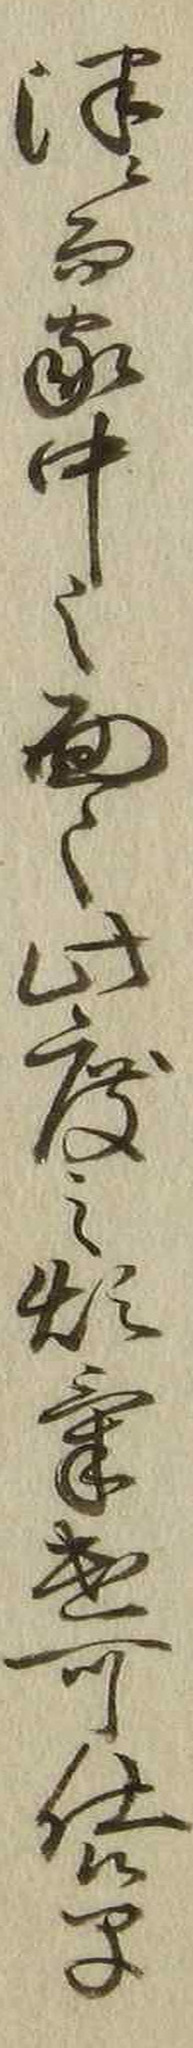津ニ而家中之面々此度之煩気遣可仕候早
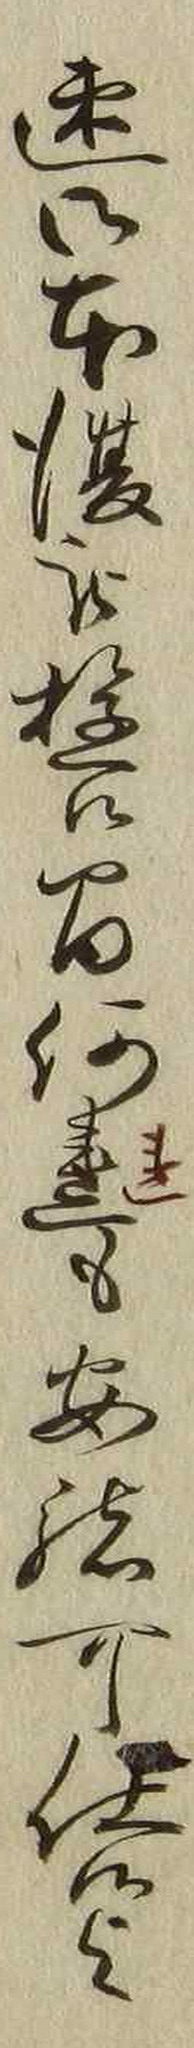速御本復被遊候間何連も安諸可仕候与
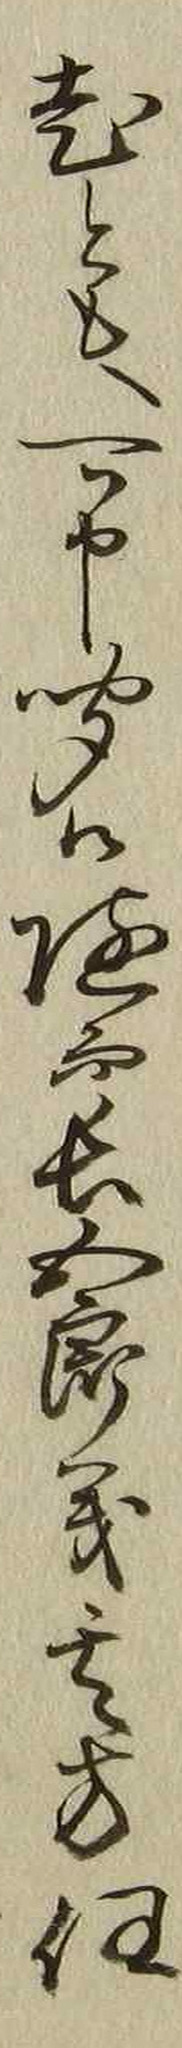老ともへ可申聞候随而長五郎義其方任
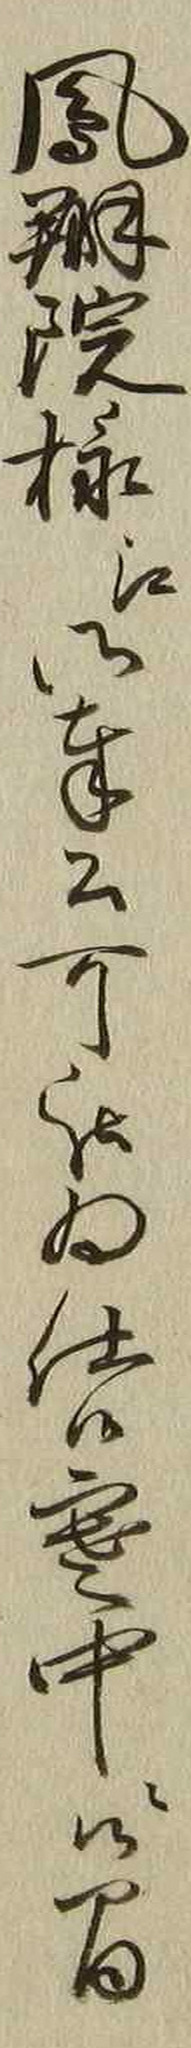鳳翔院様江御奉公可被為仕候寒中ニ候間
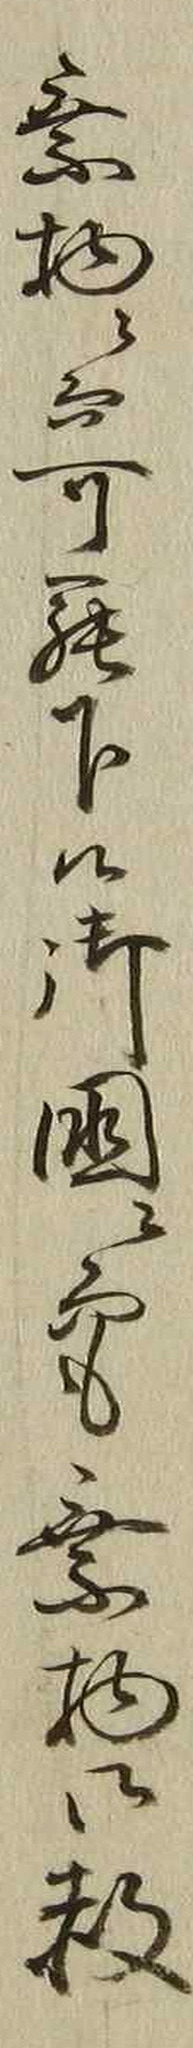乗物ニ而可罷下候御国ニ而も乗物御赦
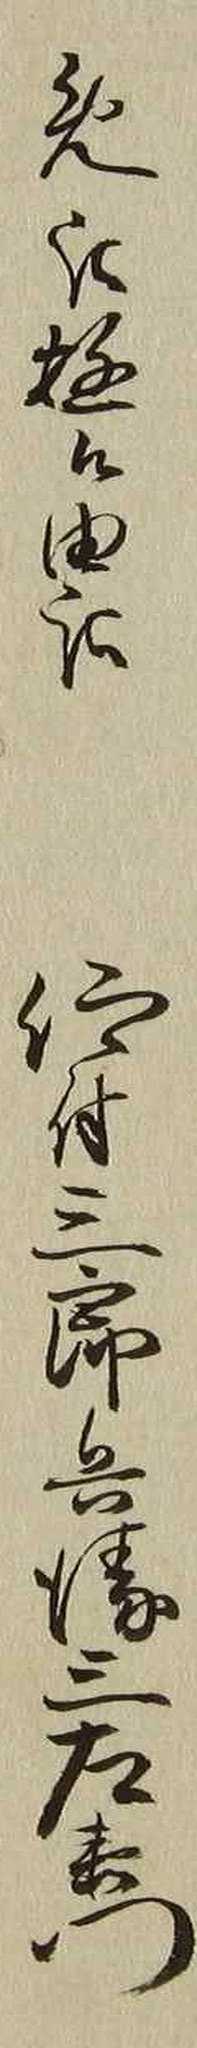免被遊候由被仰付三郎兵衛三左衛門
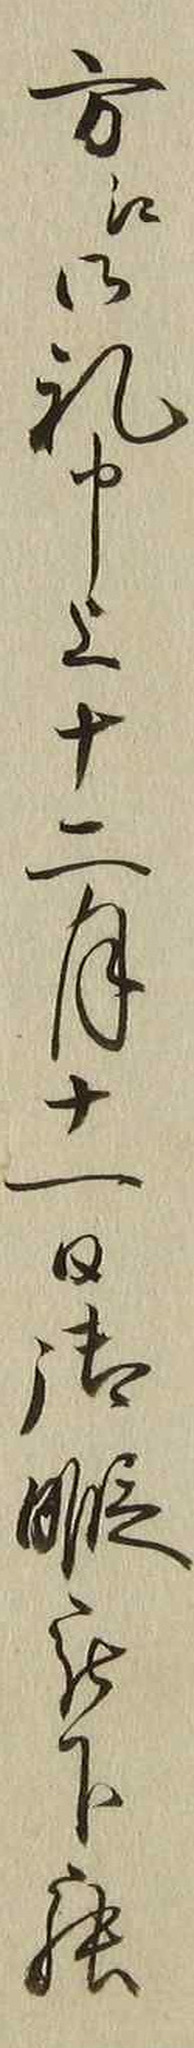方江御礼申上十二月十一日御暇被下罷
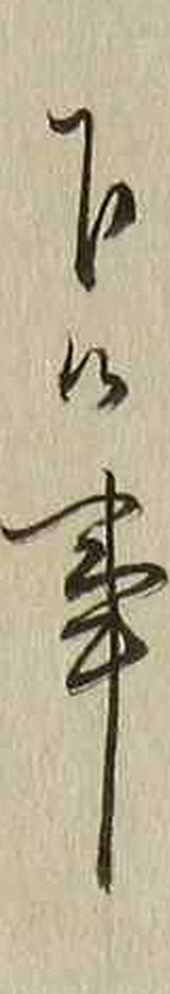下候事
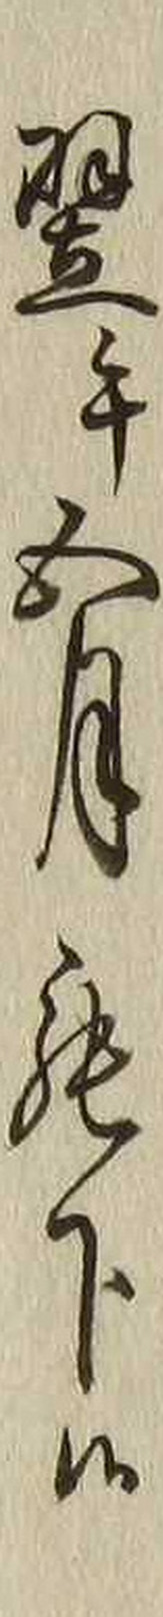翌午五月罷下候
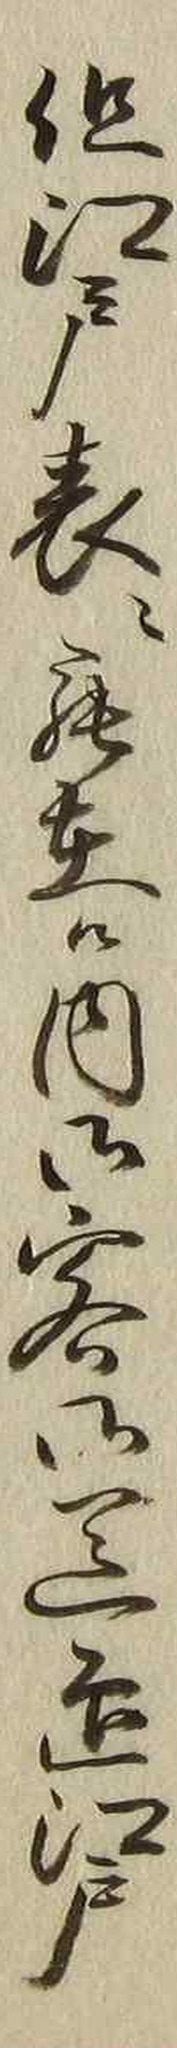但江戸表ニ罷在候内御客御送迎江戸
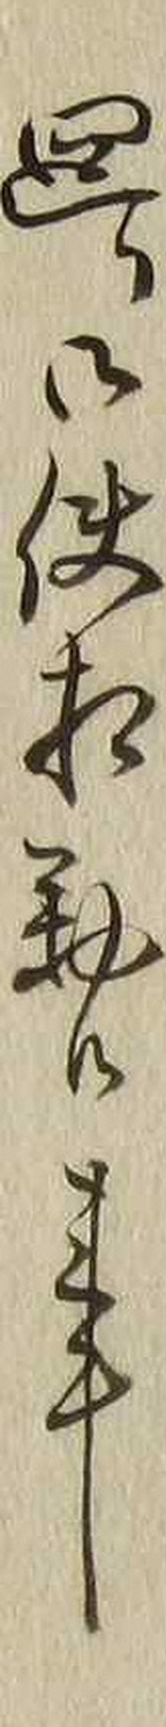廻り御使相勤候事
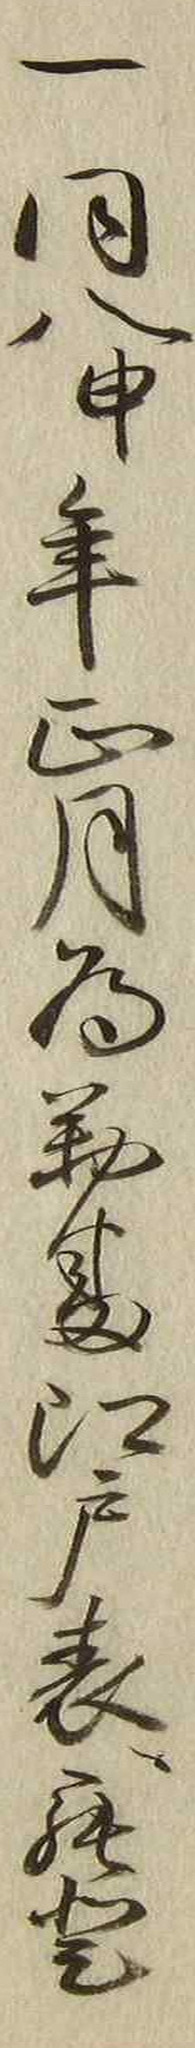一同八申年正月為金番江戸表へ罷登
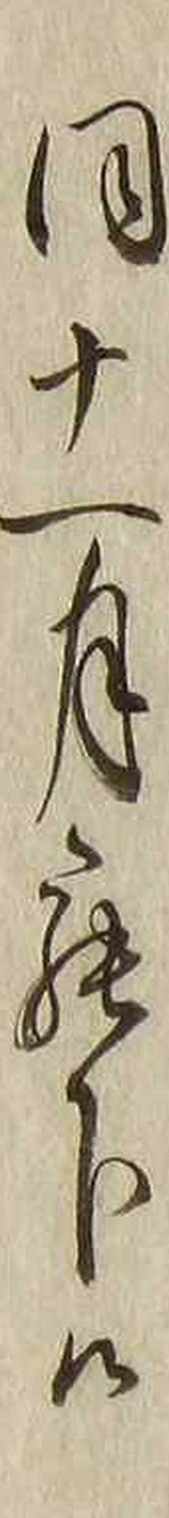同十一月罷下候
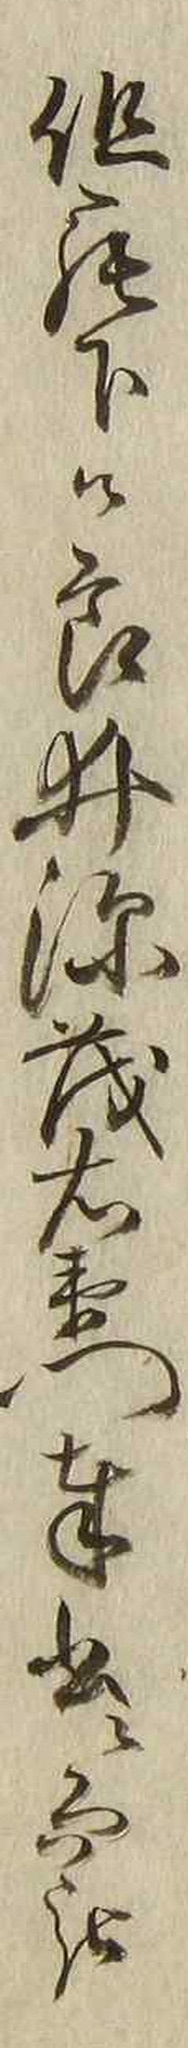但罷下候節井深茂右衛門奉書ニ而被
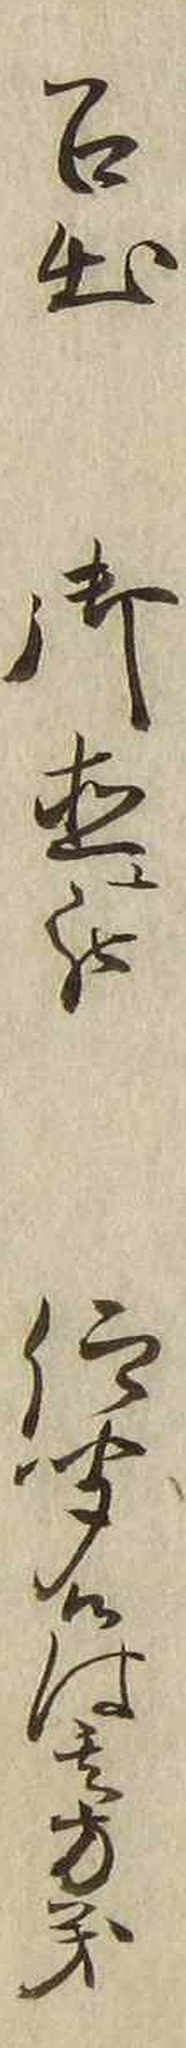召出御直ニ被仰聞候は其方儀

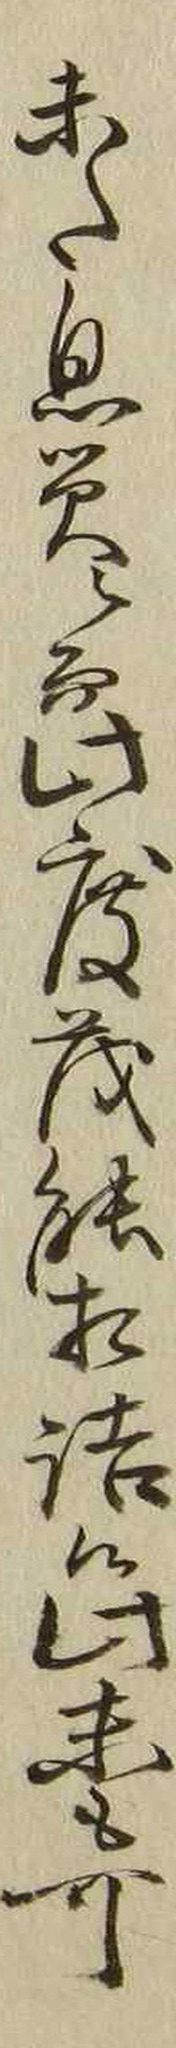未た息災ニ而此度も能相詰候此末も可
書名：諸士系譜　巻之60　と之部3
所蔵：会津若松市立会津図書館
